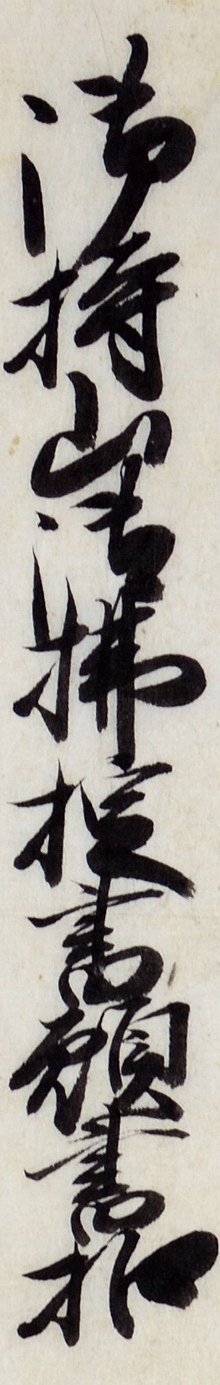御持山御払掟書願書扣
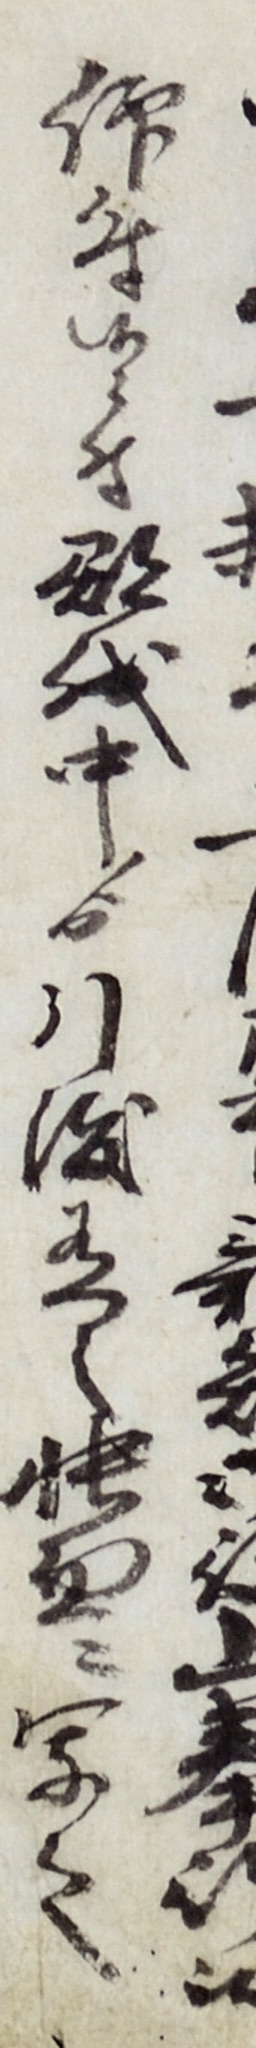仰付候ニ付郡代中ヨリ引渡有之帳面ニ写也
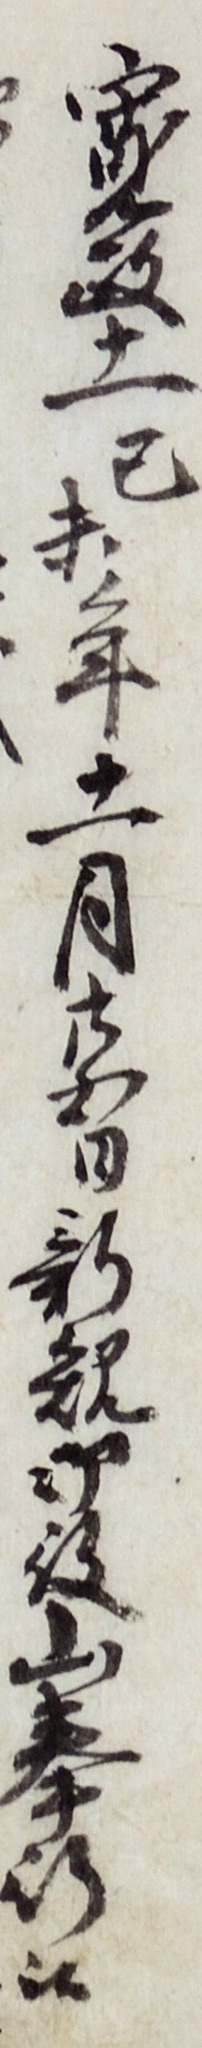寛政十一己未年十一月廿五日新規御役山奉行被
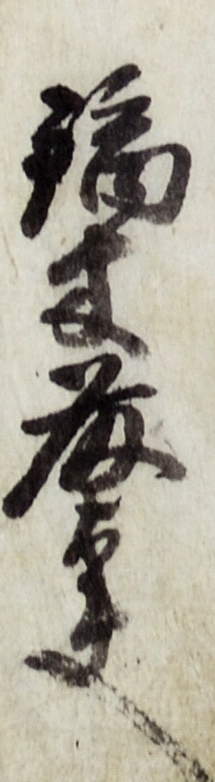鎬木藤大夫

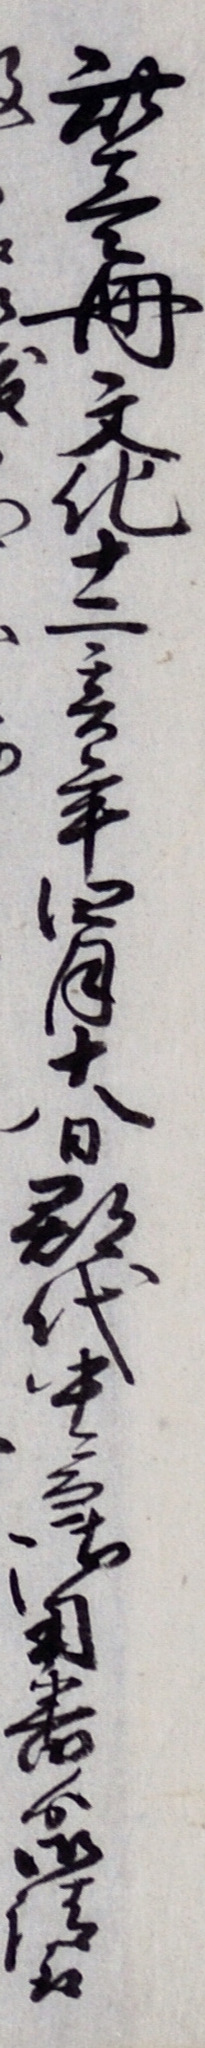此壱冊文化十二亥年四月十八日郡代中ニ而御用番ゟ御請取
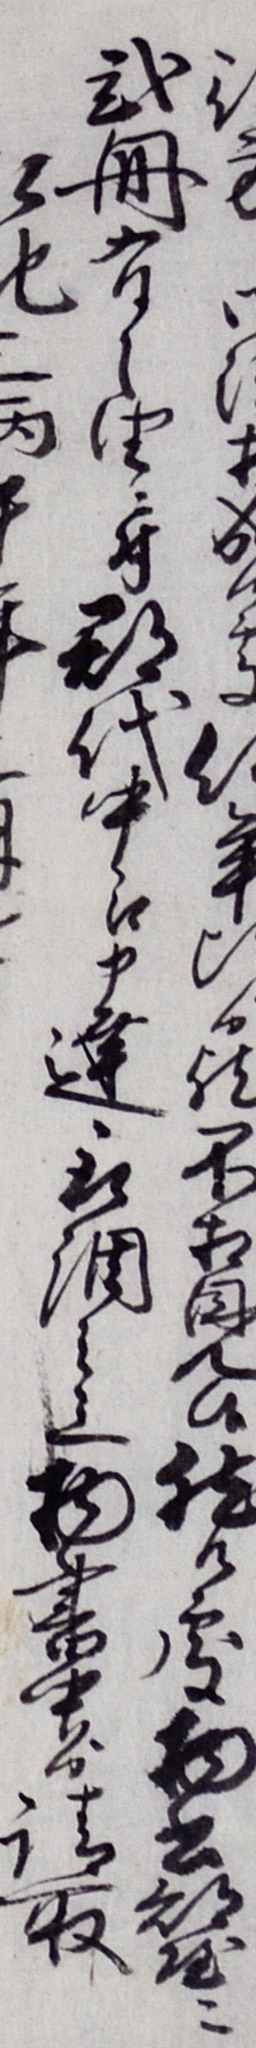弐冊有之由ニ付郡代中江申達取調之上物書中ゟ請取
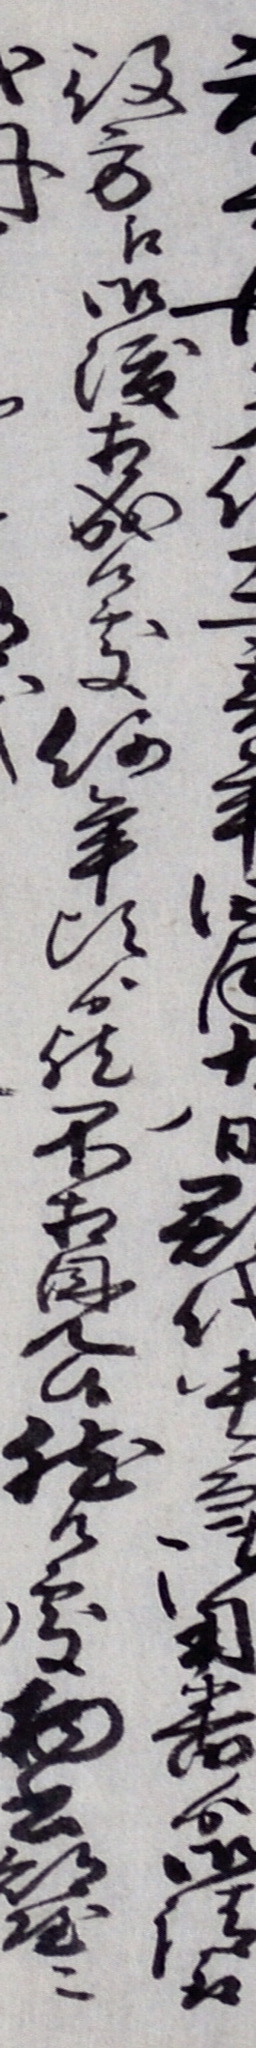役方江御渡相成候処何年頃ゟ歟不相見候然ル処物書部屋ニ
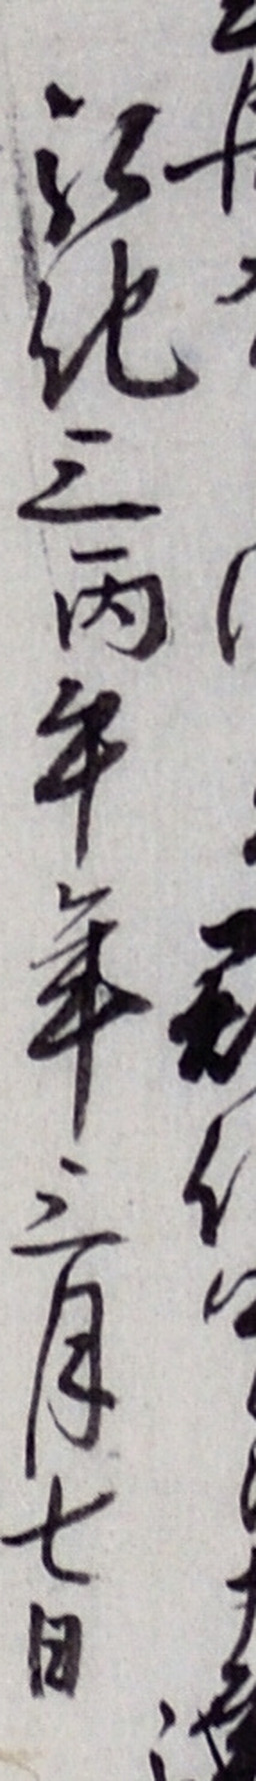弘化三丙午年三月七日
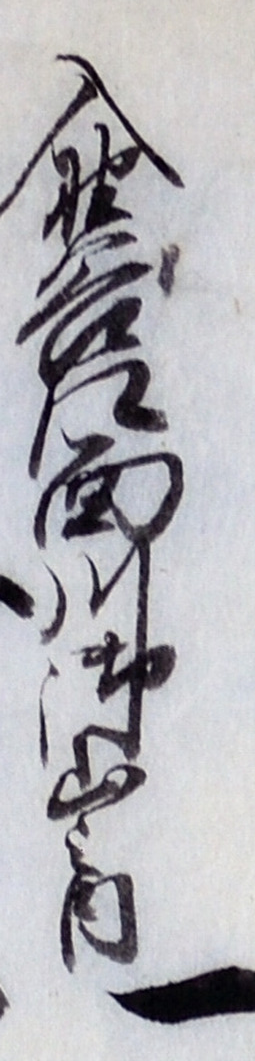入野谷郷面川御山之内
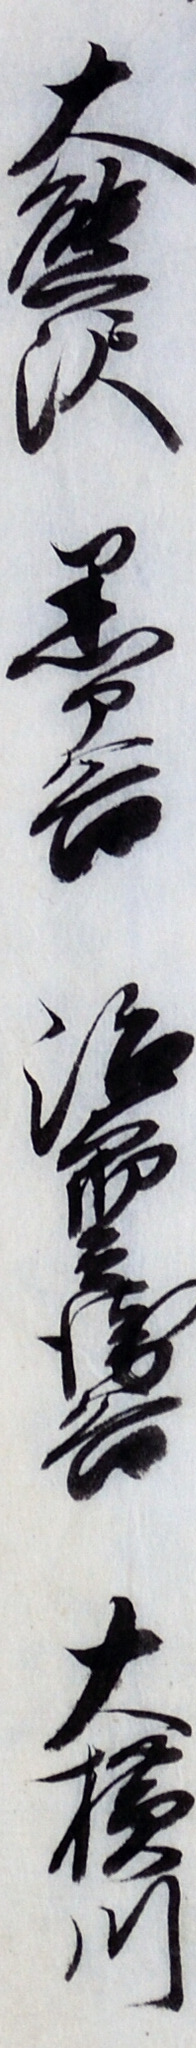大熊沢黒部谷治郎兵衛谷大横川
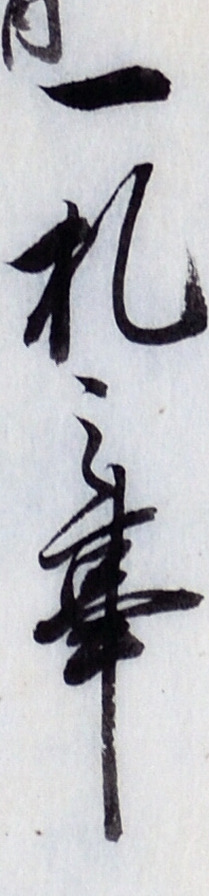一札之事
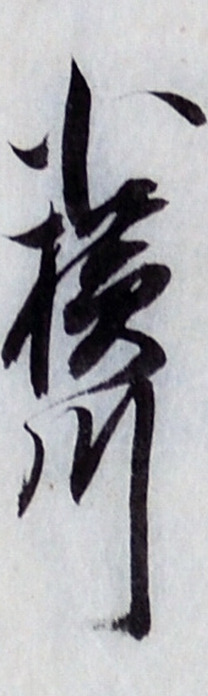小横川
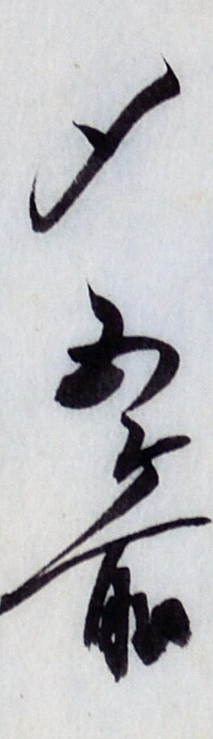〆五ヶ所
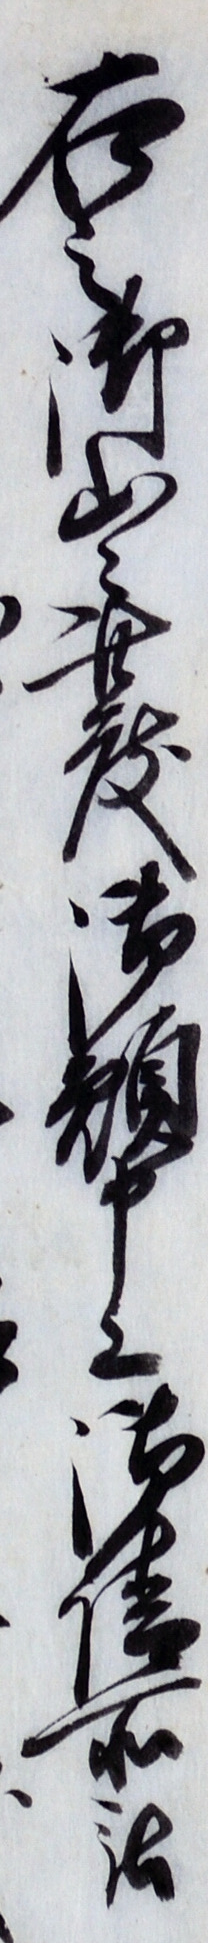右之御山々此度御願申上御請所被
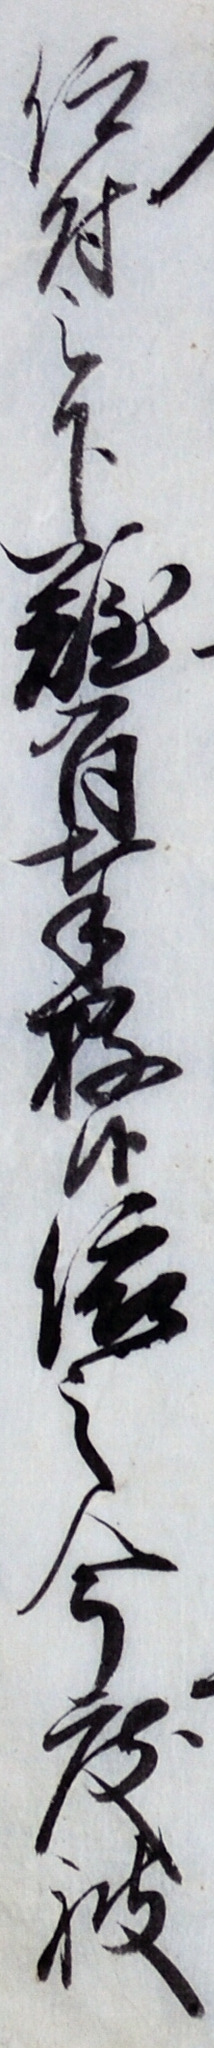仰付被下難有奉存候依之今度被
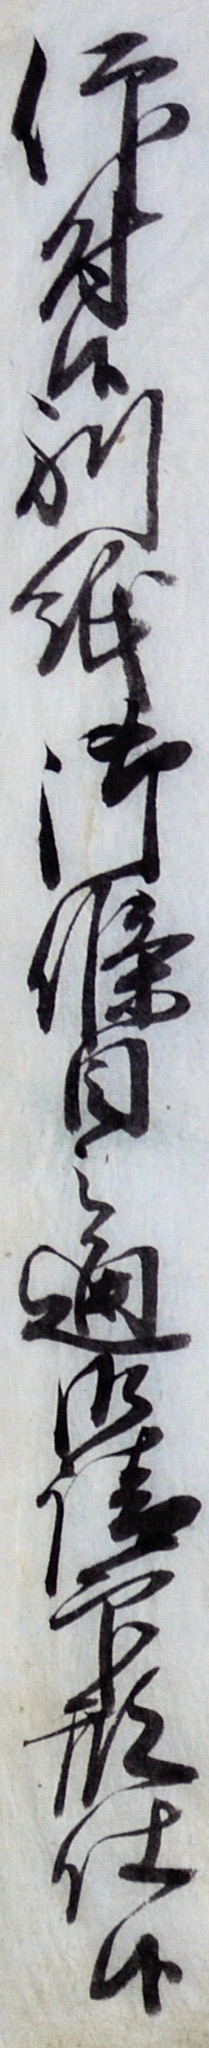仰付候別紙御條目之通御請印形仕候
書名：御持山御払掟書願書控
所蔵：伊那市立高遠町図書館・合同会社AMANE
